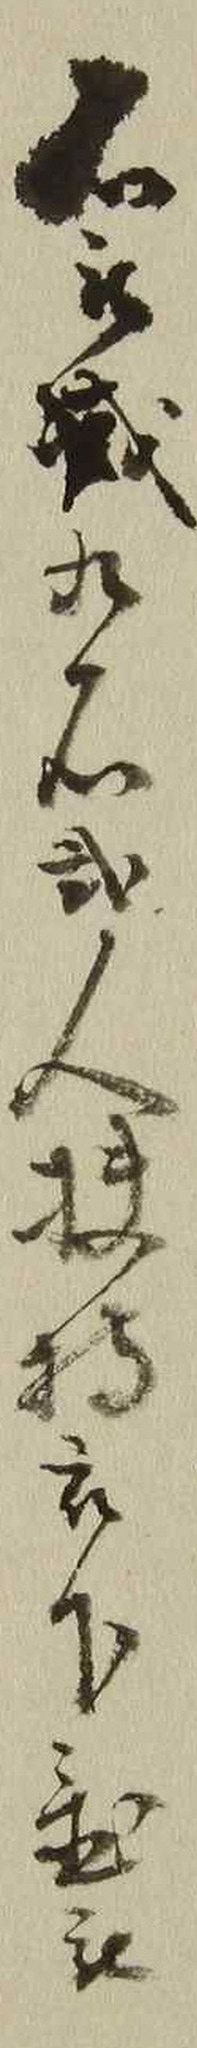石被減九石弐人扶持被下置被
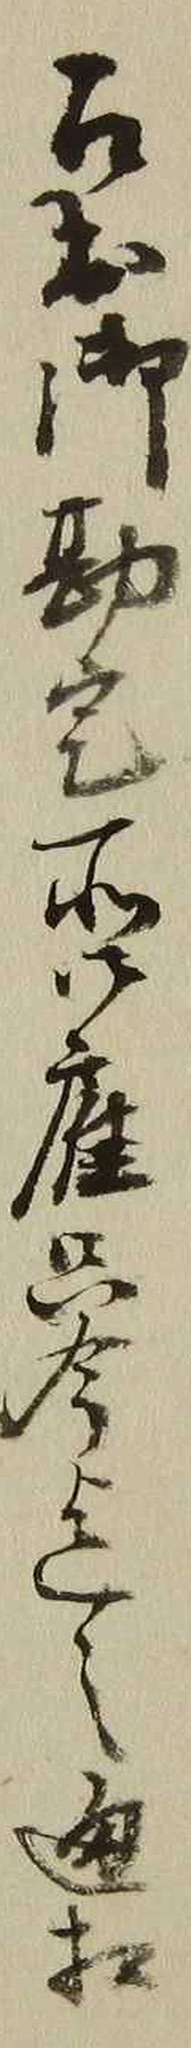召出御勘定所御雇只今迄之通相
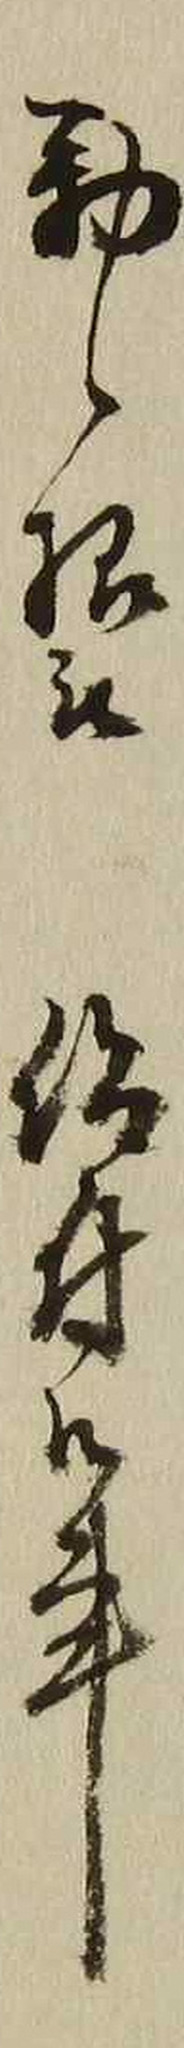勤候様被仰付候事
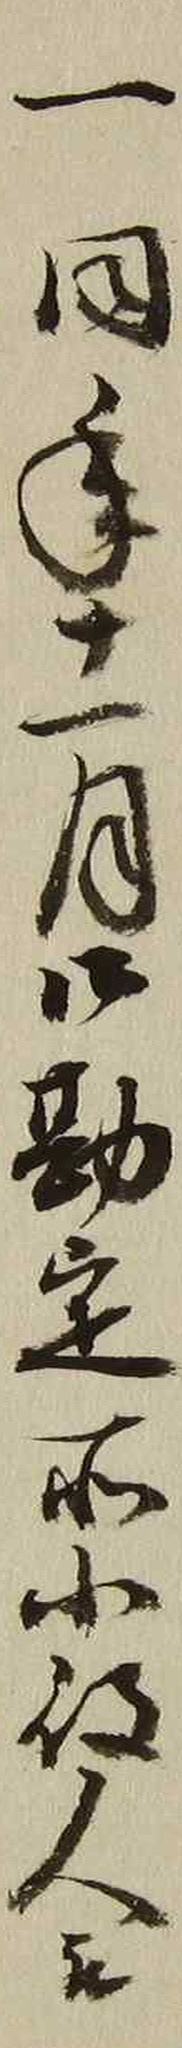一同年十一月御勘定所小役人被
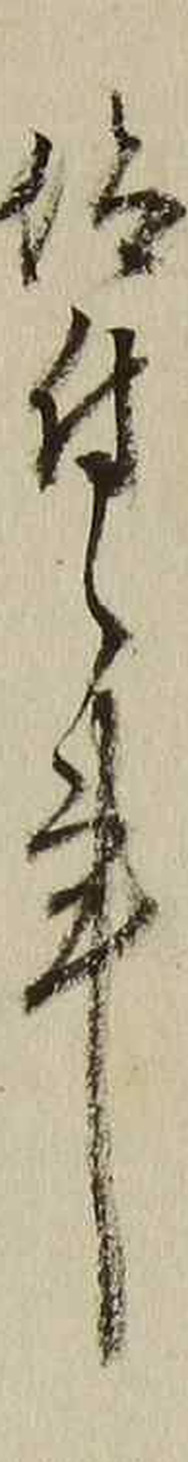仰付候事
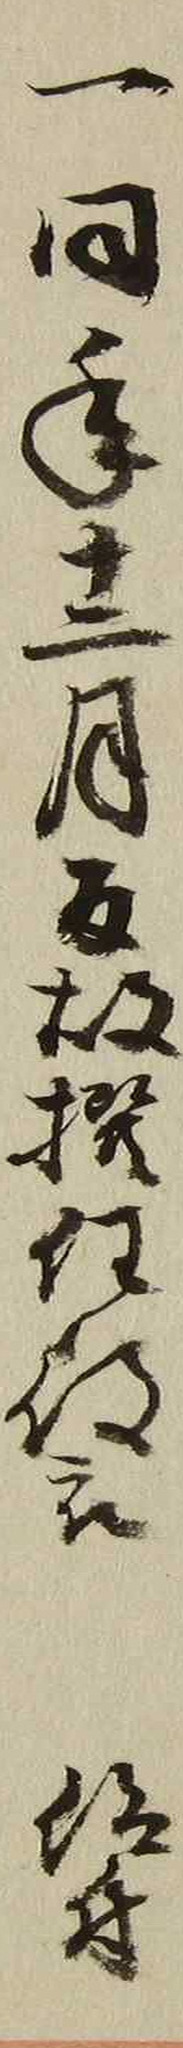一同年十二月反故撰任役被仰付
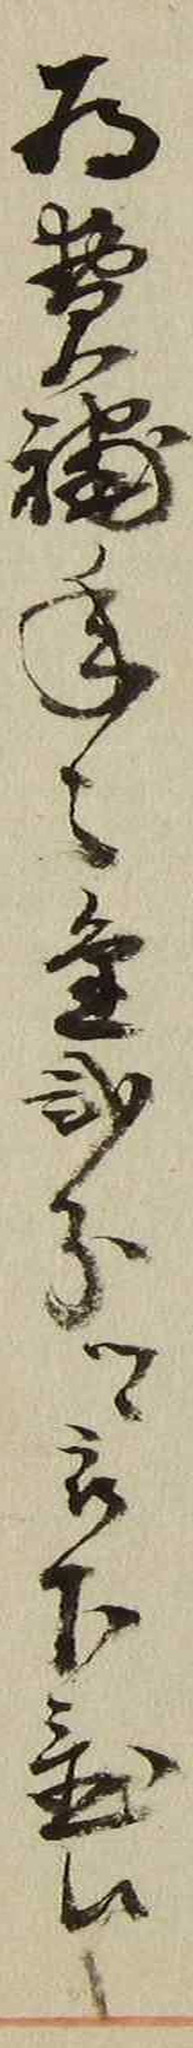為費補年に金弐分ツヽ被下置総候
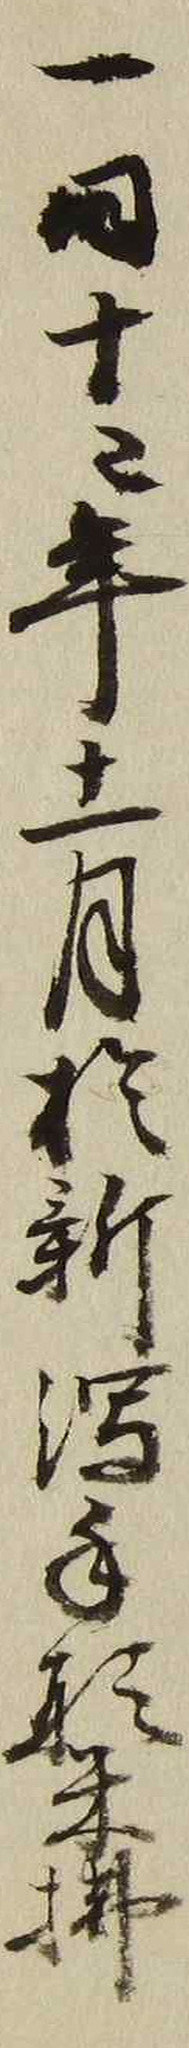一同十巳年十一月於新潟手形米払
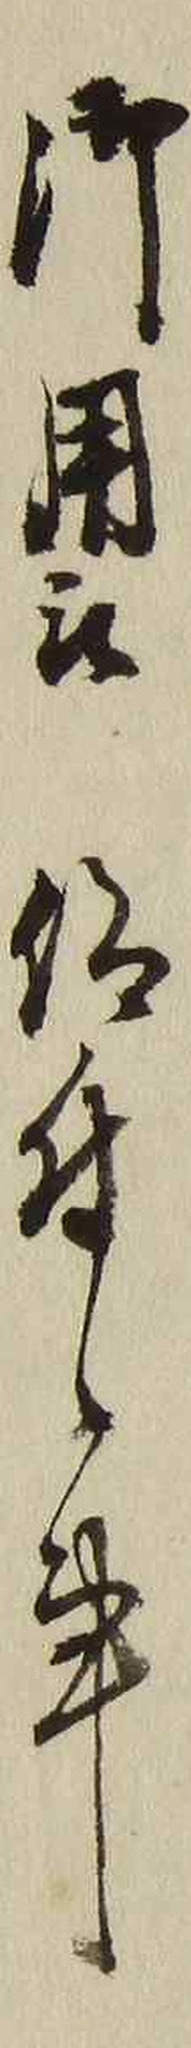御用被仰付候事
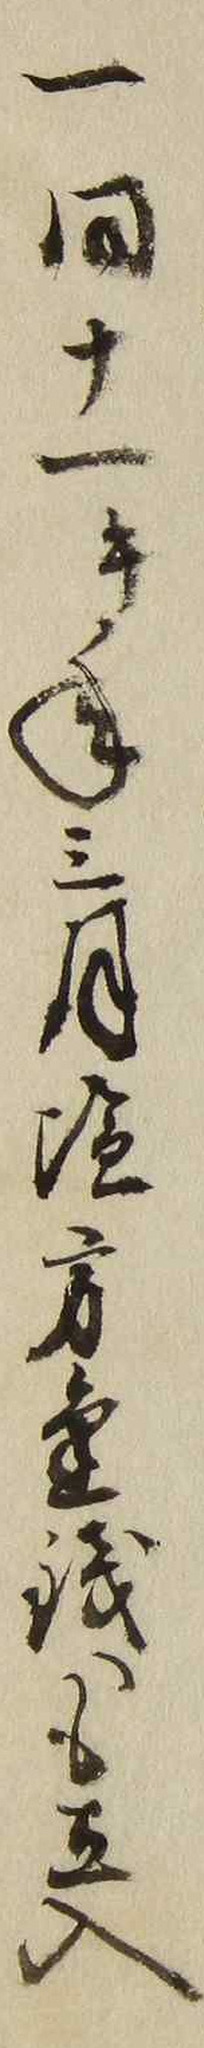一同十一午年三月塩方金銭へも立入

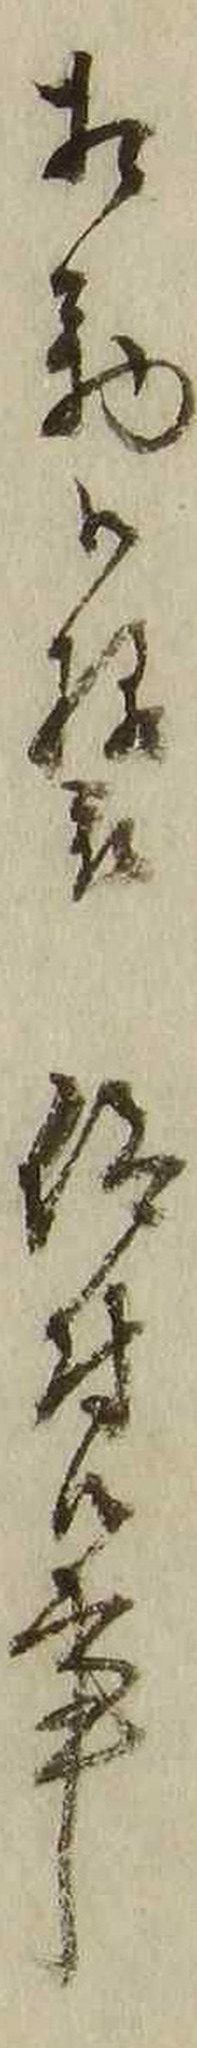相勤候様仰付候事
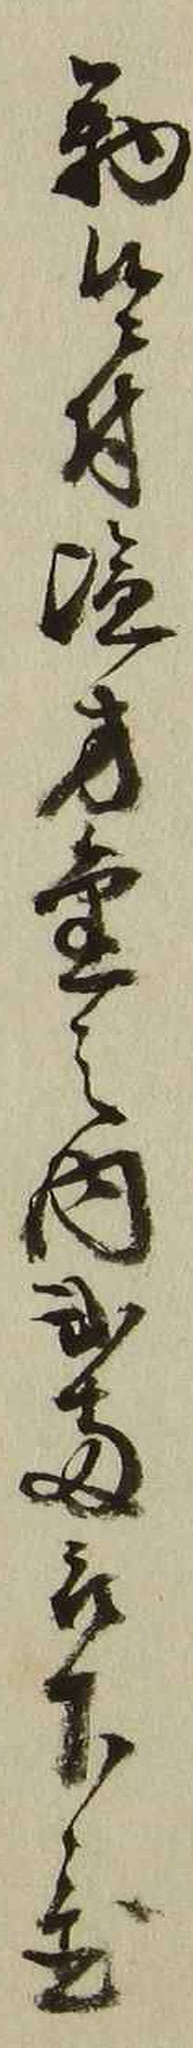勤候に付塩方金之内弐両被下置
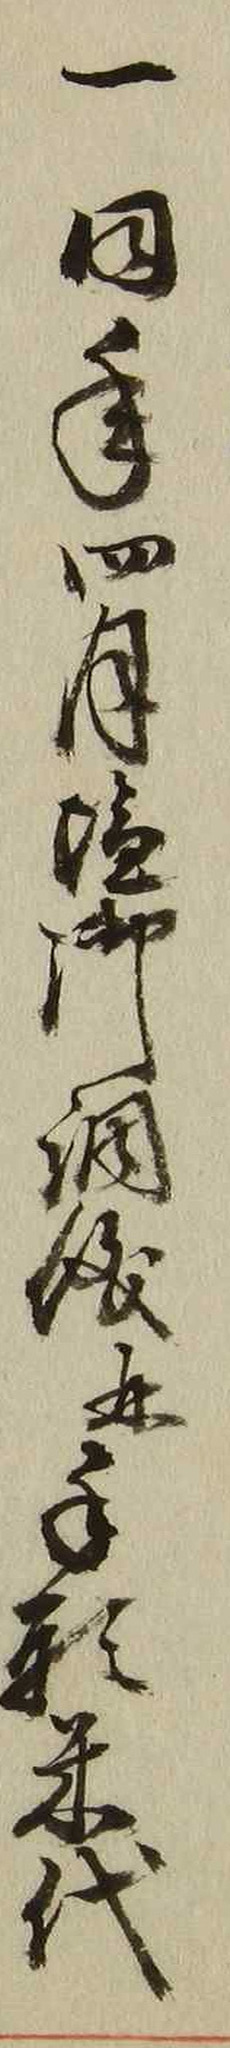一同年四月塩御調儀并手形米代
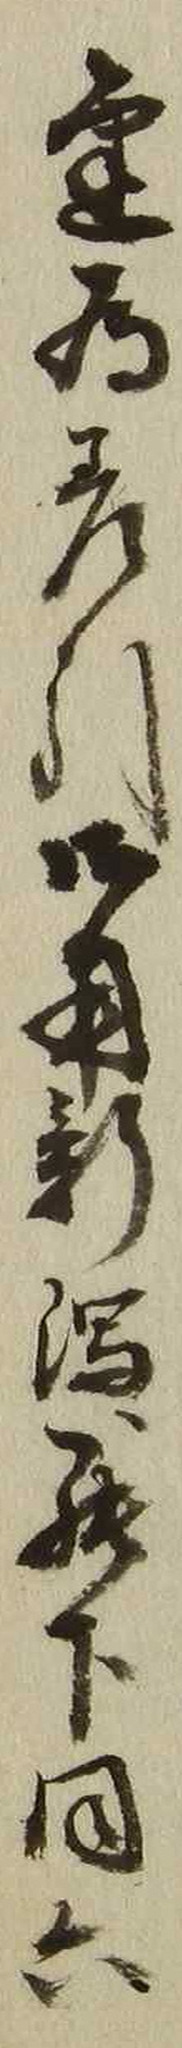金為差引御用新潟へ罷下同六
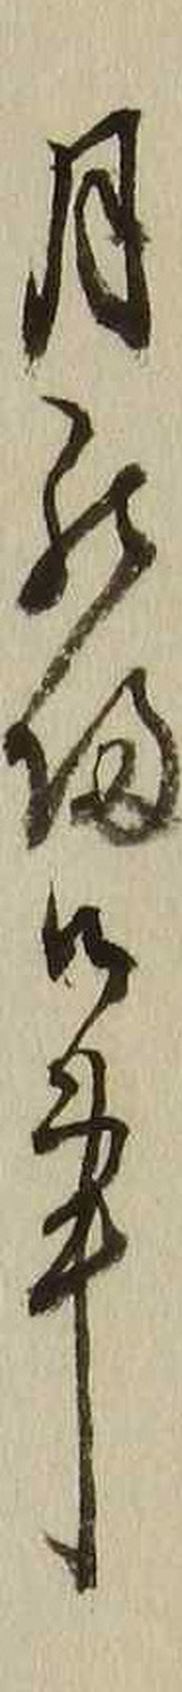月罷帰候事
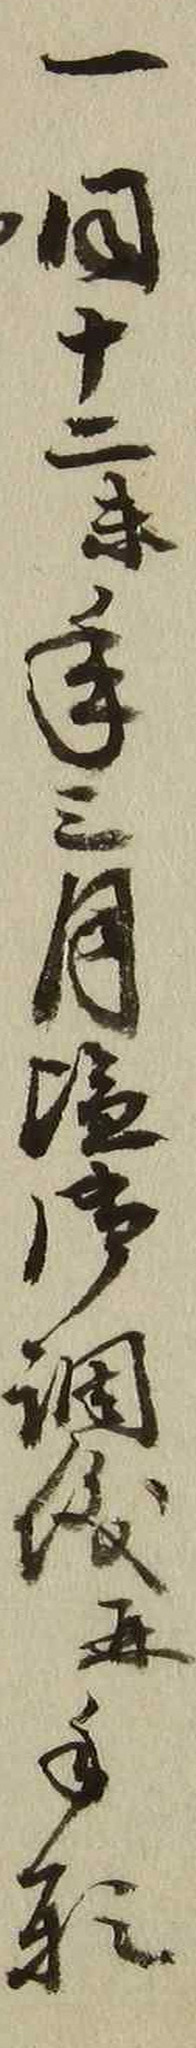一同十二未年三月塩御調儀并手形
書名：諸士系譜　巻之38　は之部6
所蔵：会津若松市立会津図書館
